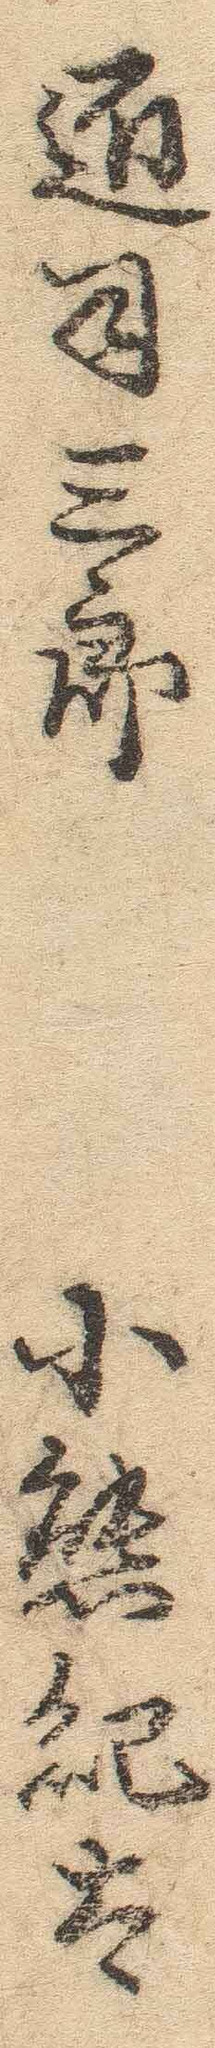通司三郎小熊紀太
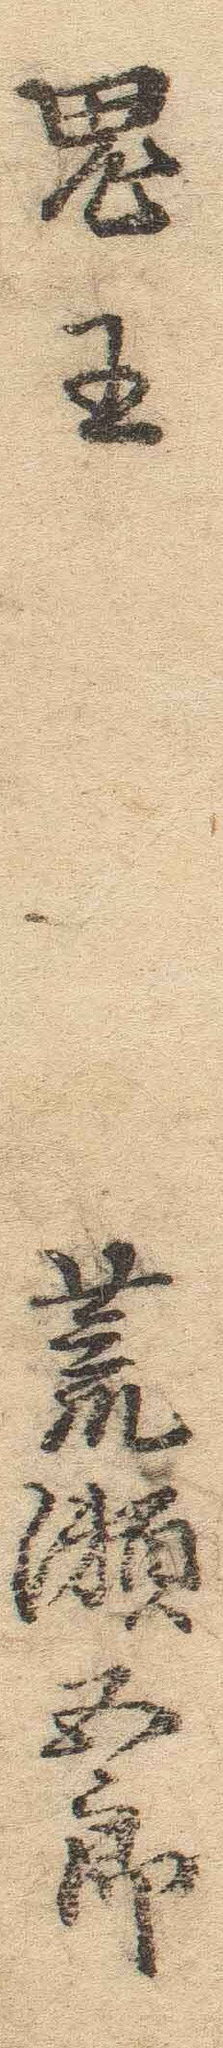鬼王荒瀬五郎

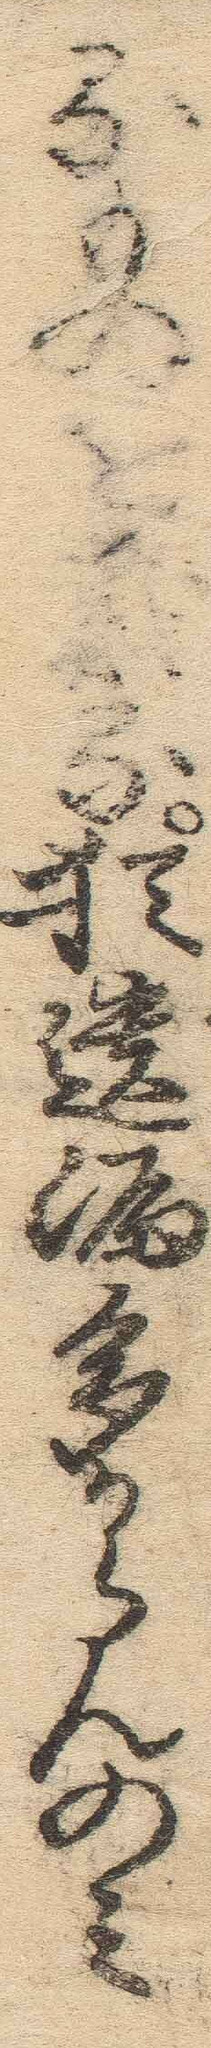るものを載る。猶遺漏多からんのみ
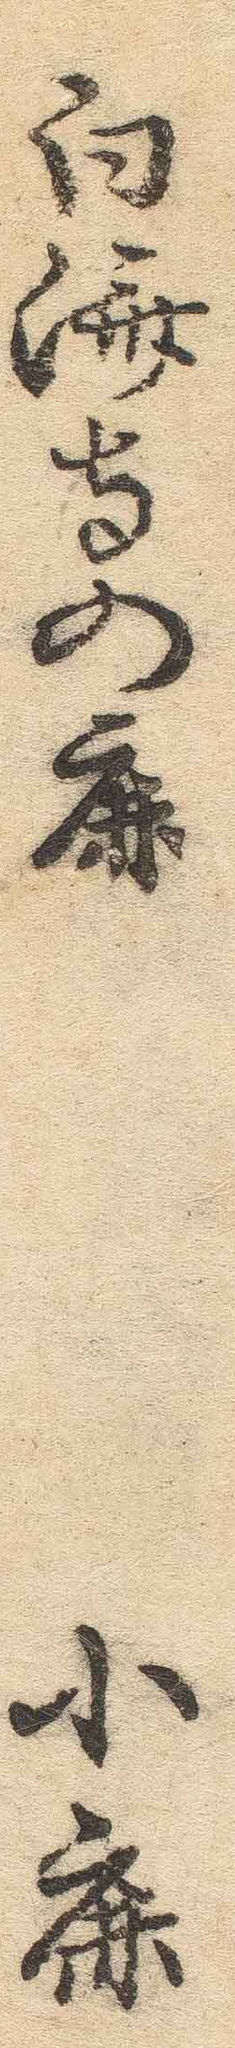白洲寺の鹿小鹿
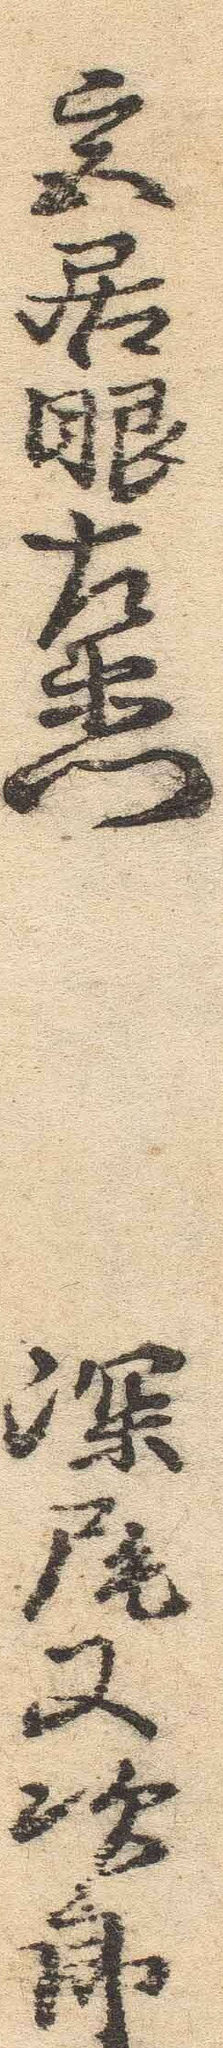宮居眼左衛門深尾又次郎
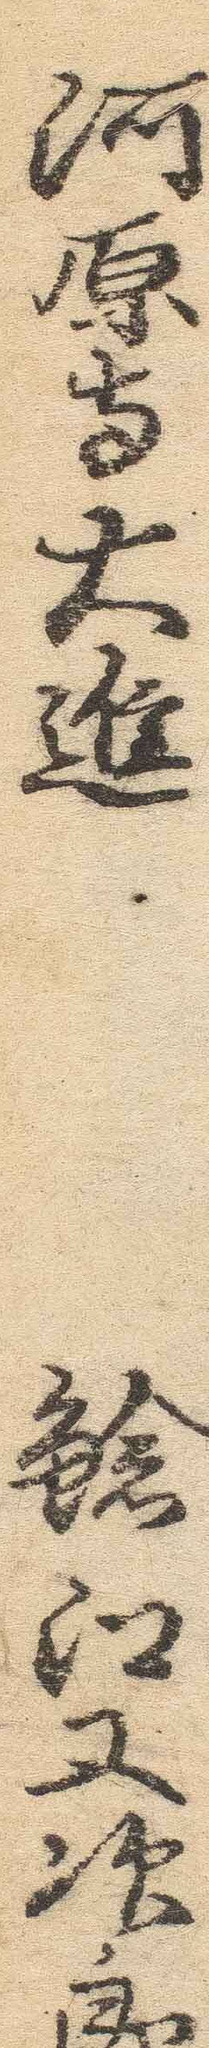河原寺大進鯰江又次郎

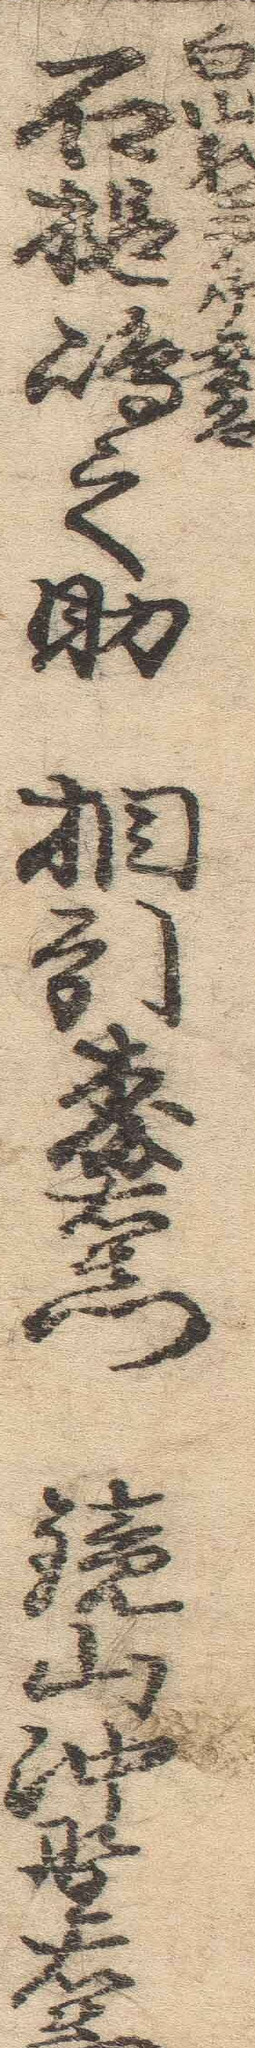石槌嶋之助相引森右衛門鏡山沖野右衛門矢嶋沖右衛門
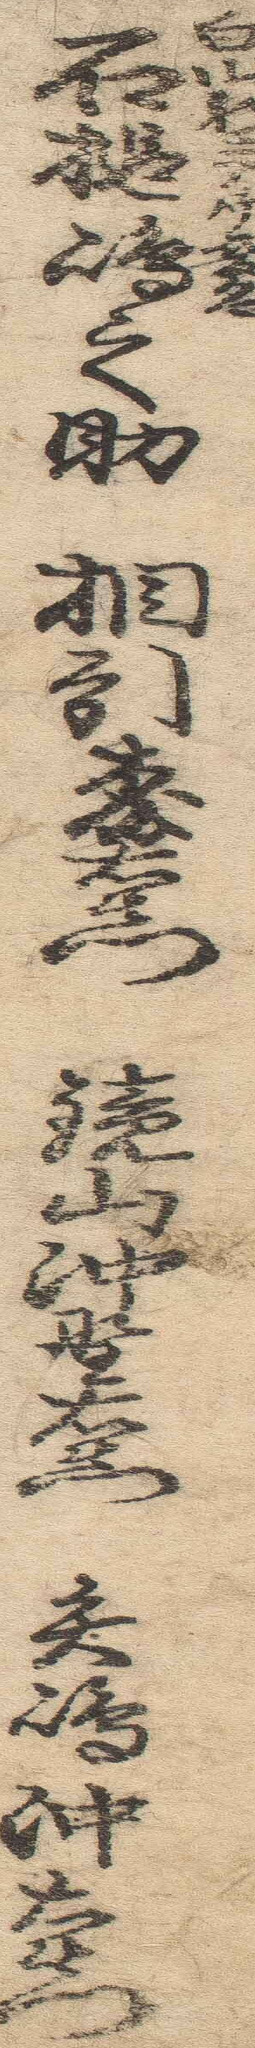石槌嶋之助相引森右衛門鏡山沖野右衛門矢嶋沖右衛門
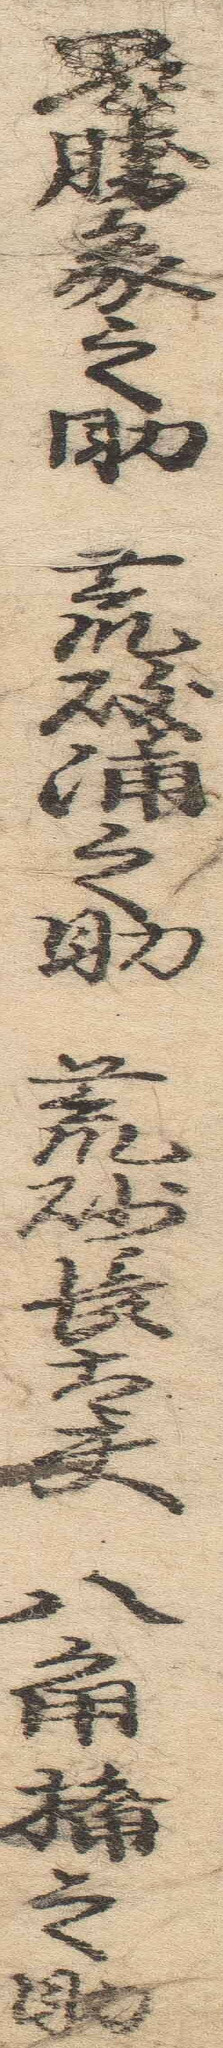鬼勝象之助荒磯浦之助荒砂長太夫八角楯之助
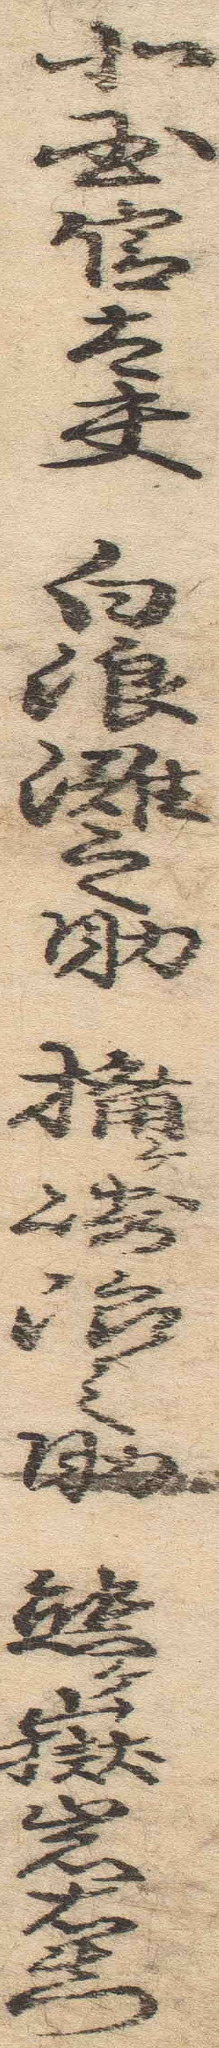北国官太夫白浪灘之助楯ヶ崎浪之助熊ヶ嶽岩右衛門
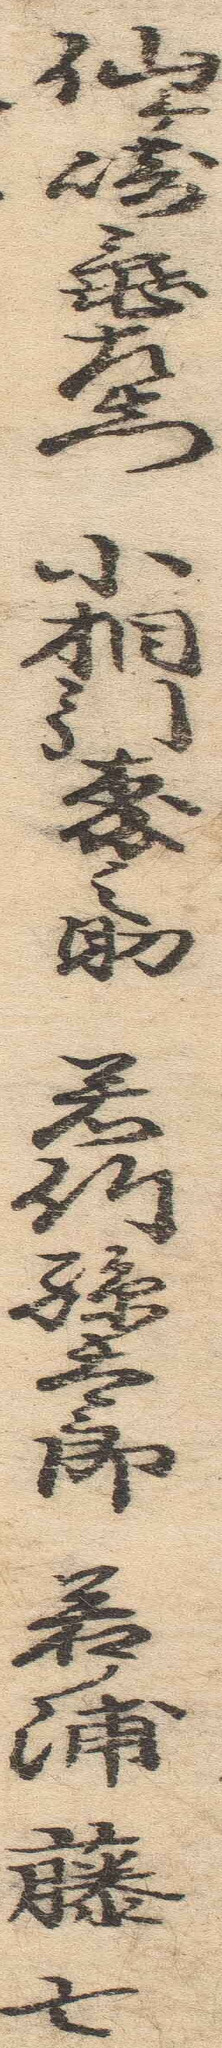仙ヶ崎亀左衛門小相引森之助若竹孫太郎若ノ浦藤七
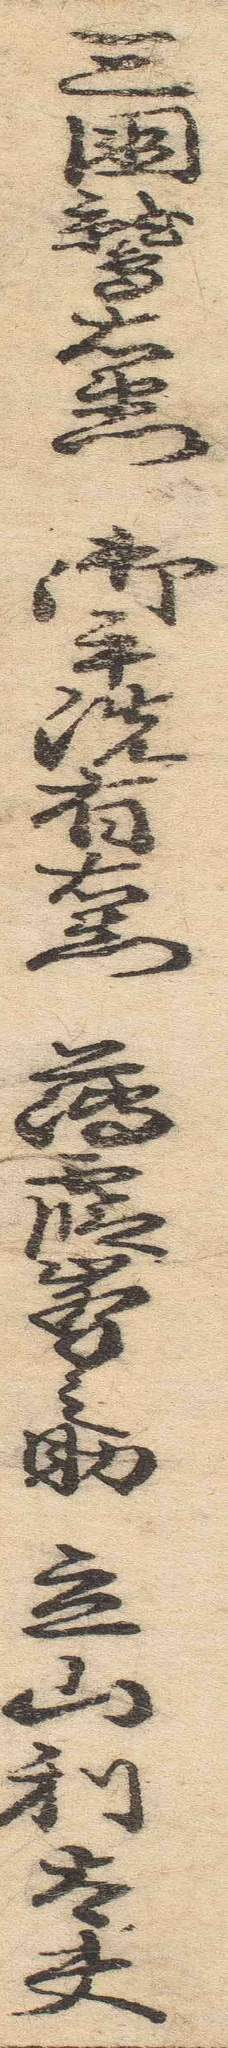三国鷲右衛門御手洗有右衛門薄霞峯之助立山利太夫
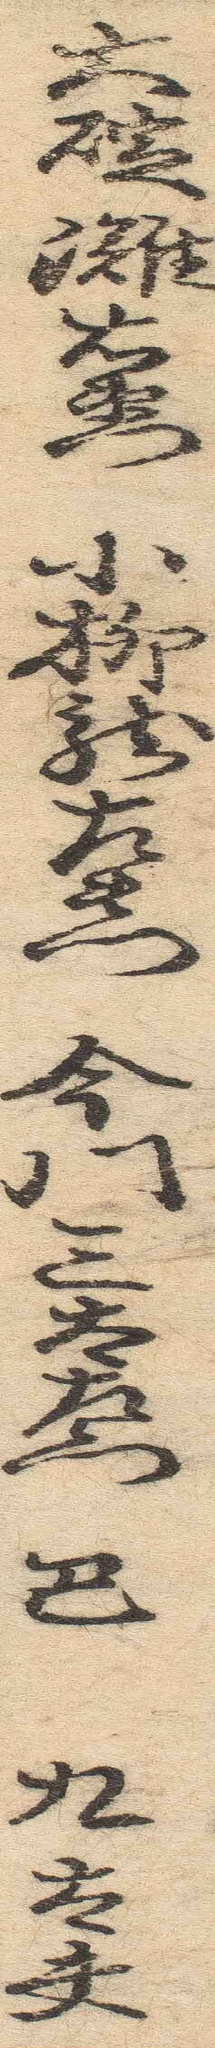大碇灘右衛門小柳龍左衛門今川三太左衛門巴九太夫
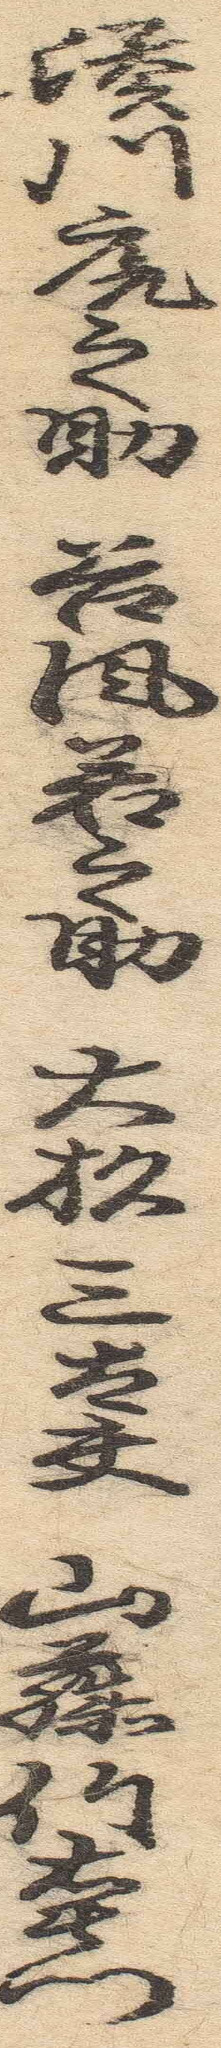湊川虎之助谷風若之助大杉三太夫山森竹右衛門
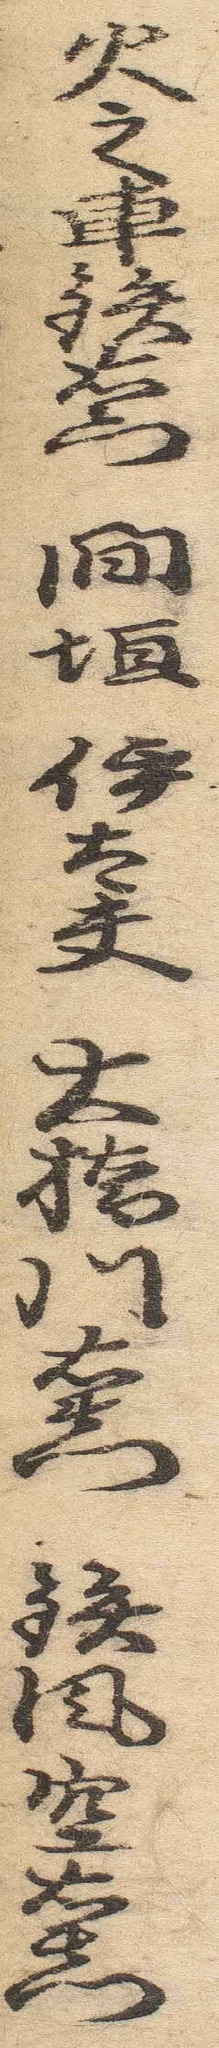火之車鉄右衛門間垣伊太夫大橋川右衛門鉄風空右衛門
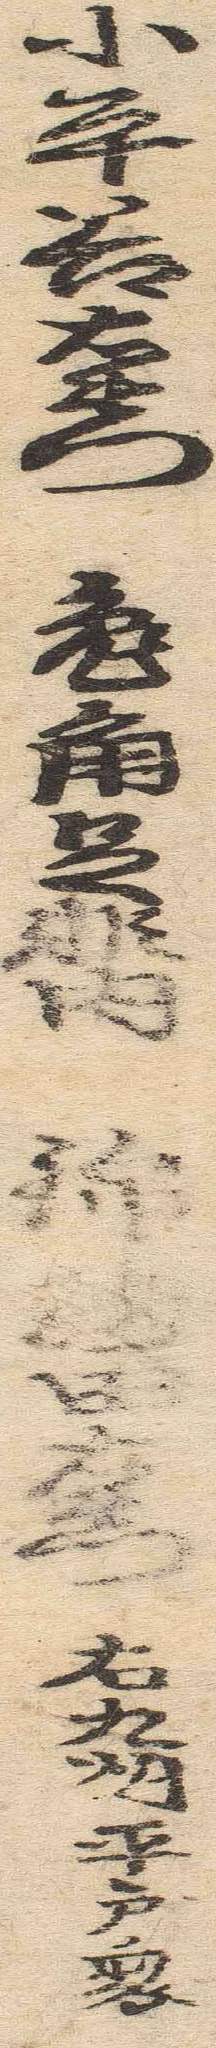小平善右衛門兎角是非内錦龍田左衛門右九州平戸衆
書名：古今相撲大全
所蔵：東京学芸大学附属図書館 国文学研究資料館
